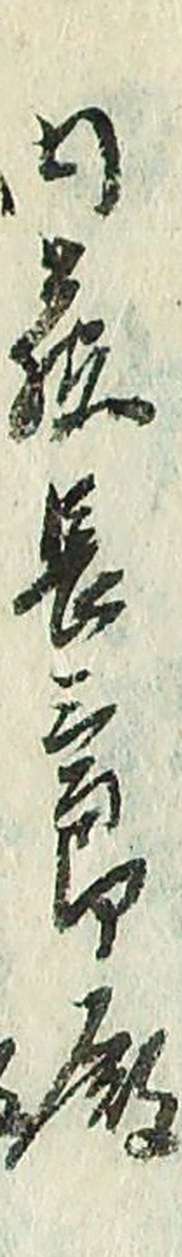内藤長三郎殿
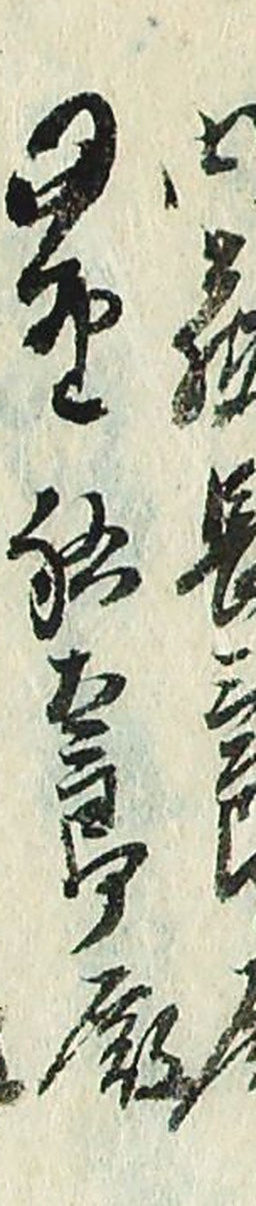田野祐太郎殿
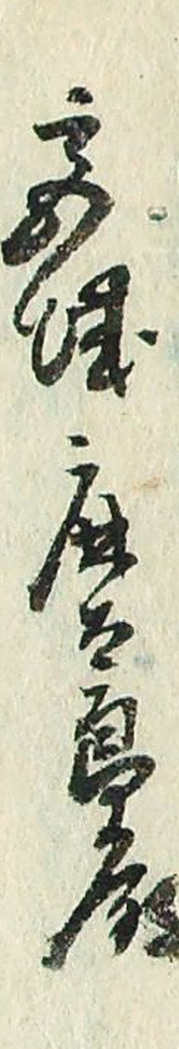宮城麻太郎殿

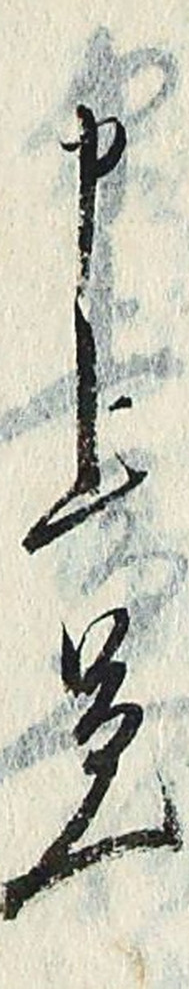申上覚
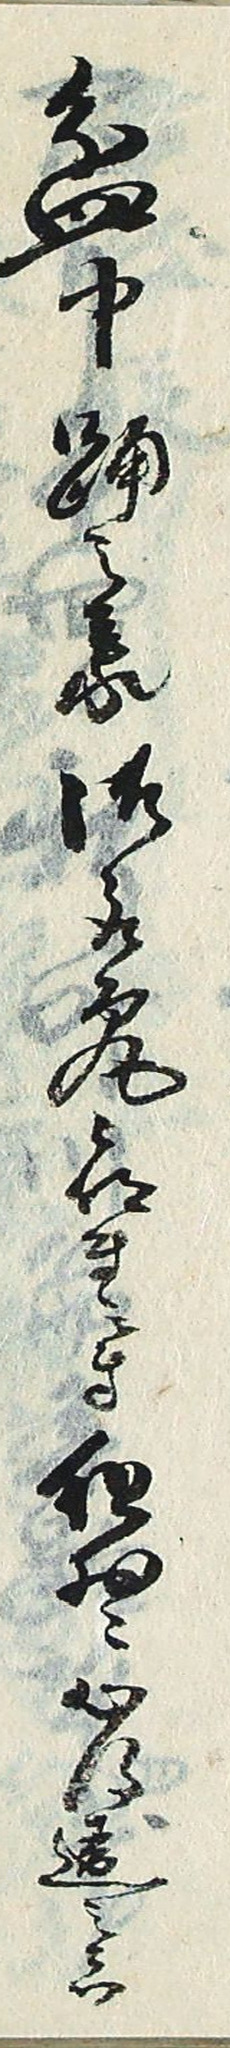盆中踊之義御取究被仰付候に付組村々心得違之者
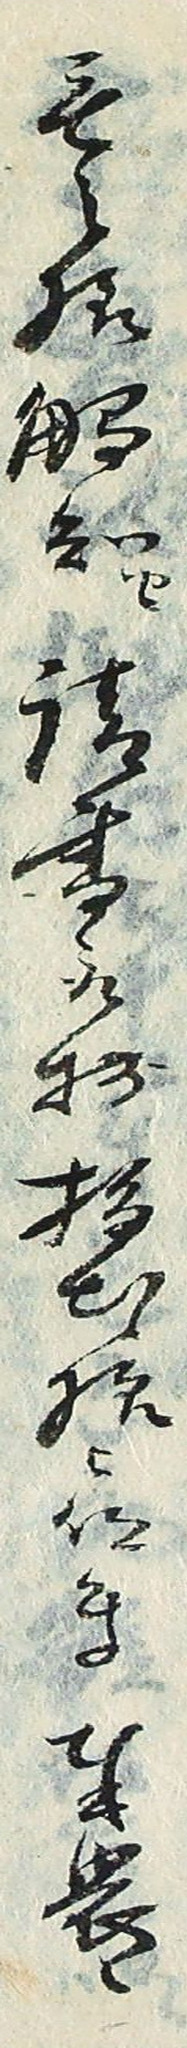無之様触知せ請書取揃指出候様被仰付奉畏候
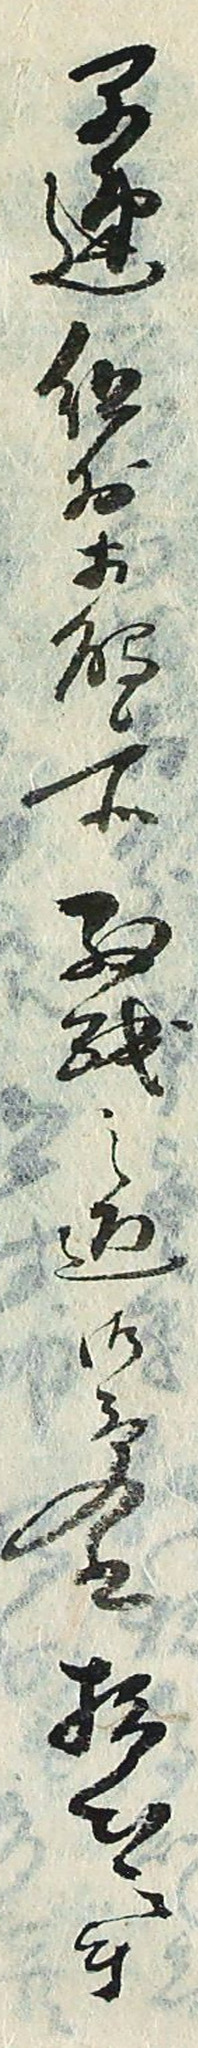早速組村相触候所別紙之通御受書指出候に付
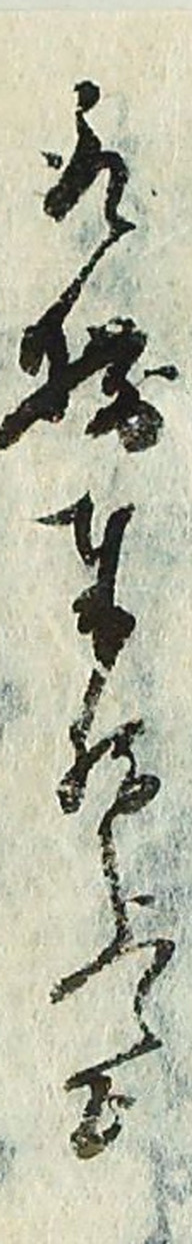取揃奉指上候以上
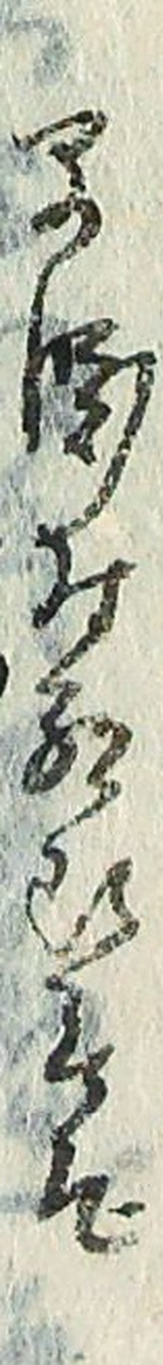早淵村組頭庄屋
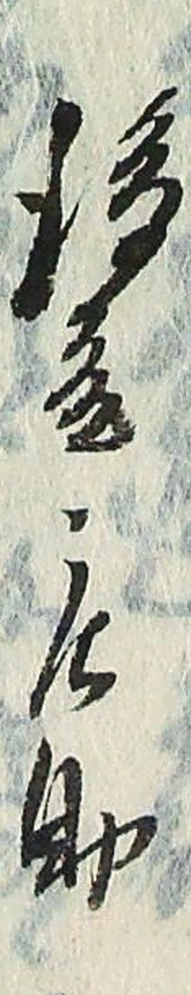後藤庄助
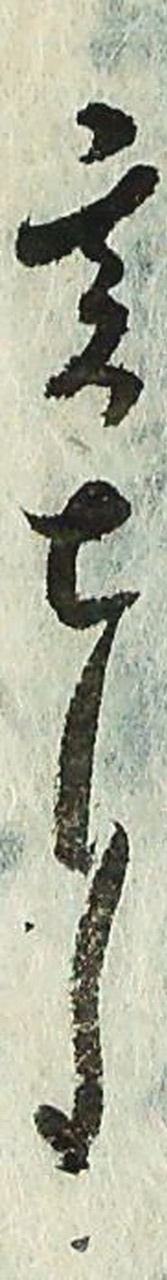亥七月
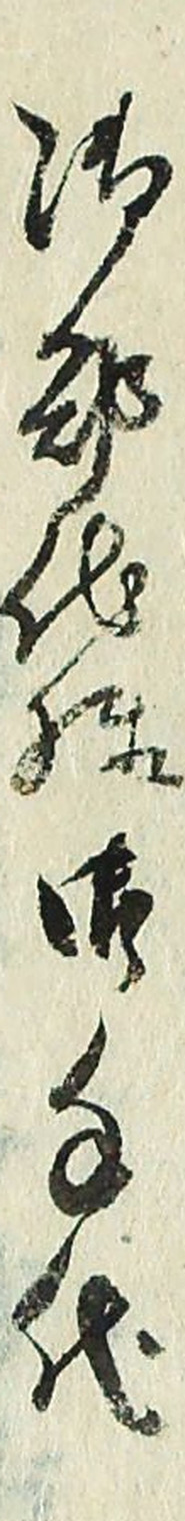御郡代様御手代
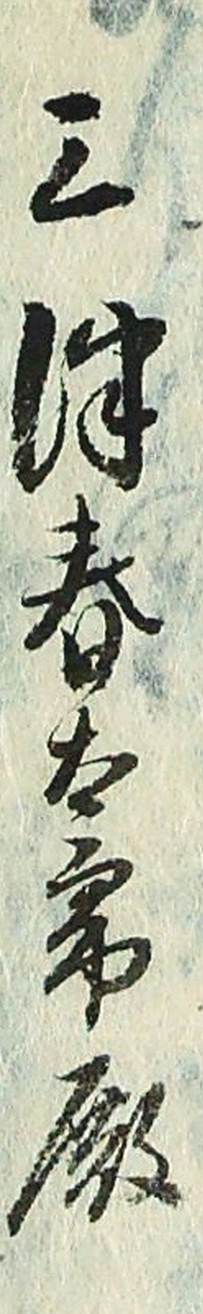三沢春太郎殿
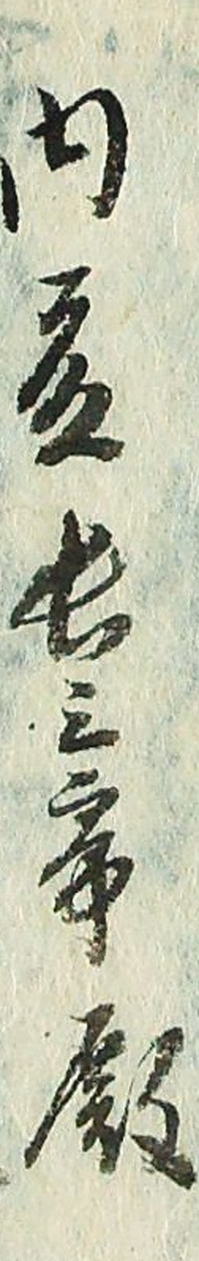内藤長三郎殿
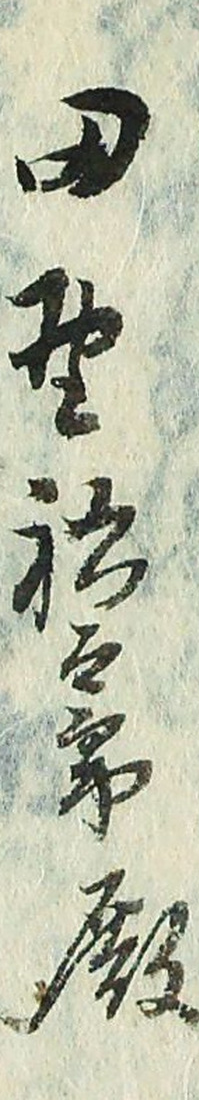田野祐太郎殿
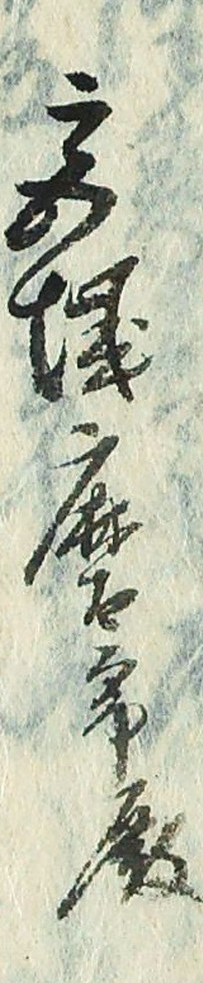宮城麻太郎殿
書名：諸御用御□受書控
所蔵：鳴門教育大学 Naruto University of Education
